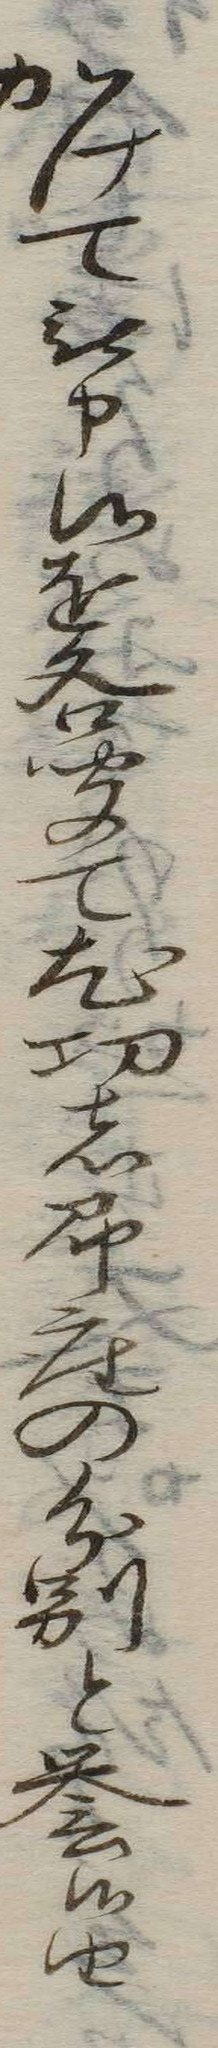かけて被申候を各聞て尤功者即座の分別と誉候由
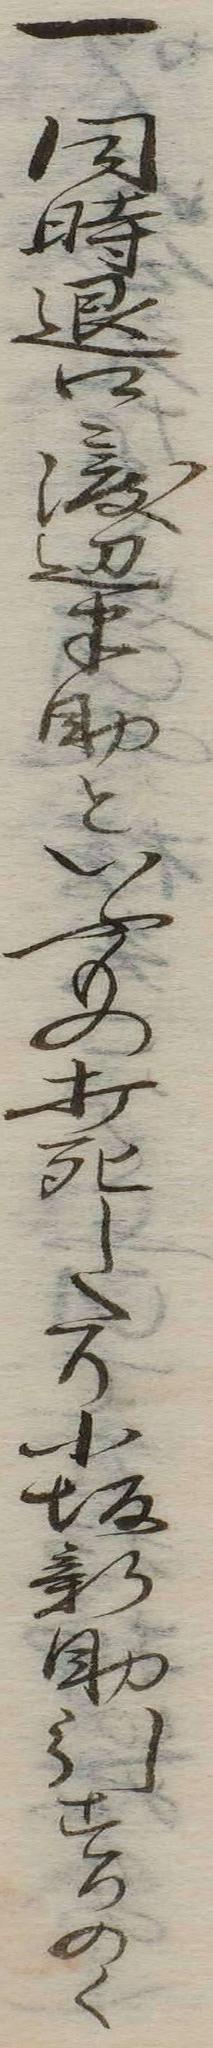一同時退口ニ渡辺半助といふもの打死したり小阪新助引すりのく
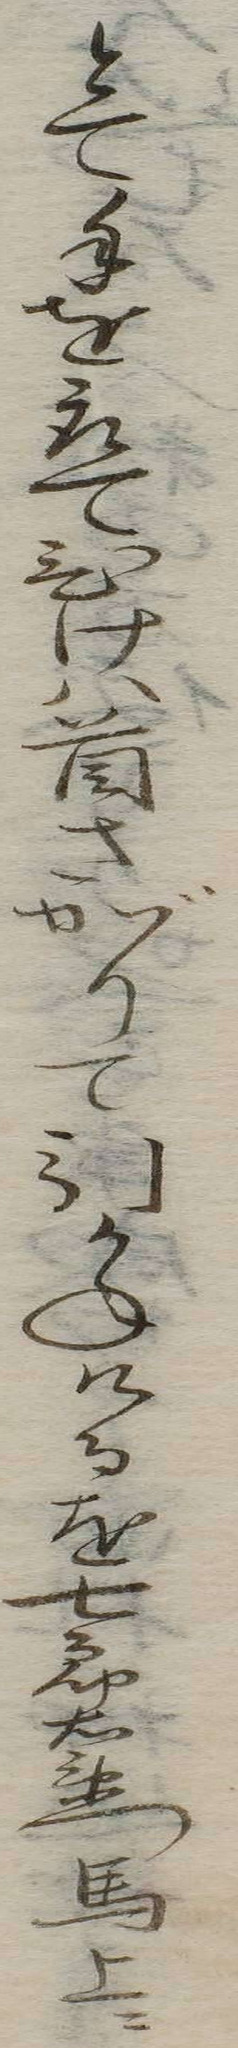とて手を取てひけは首さがりて引かねけるを七郎右衛門馬上ニ
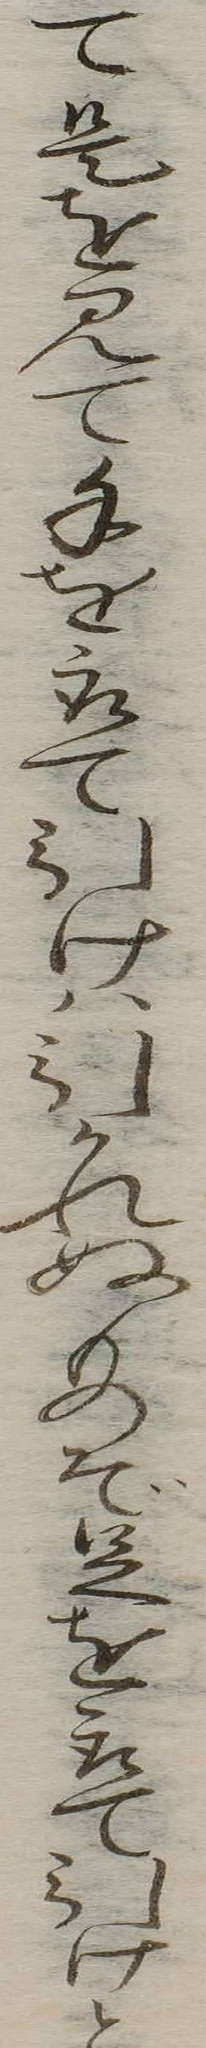て是を見て手を取て引けは引かれぬものぞ足を取て引けと
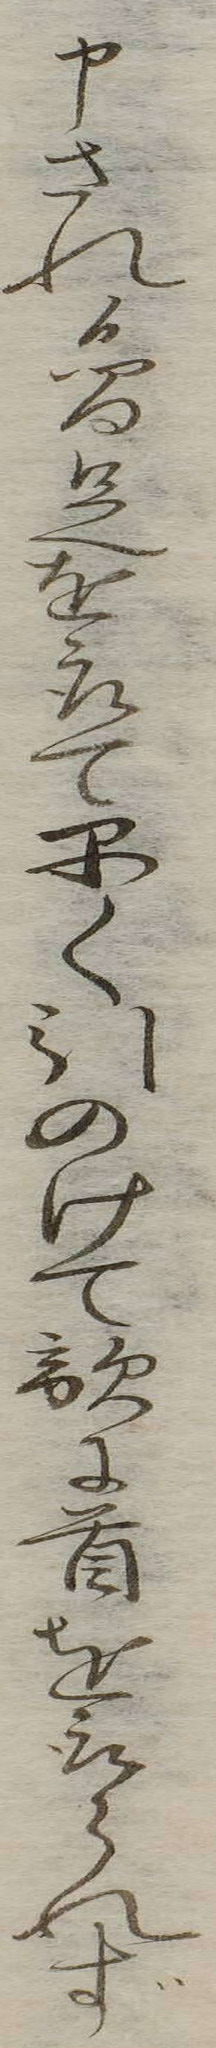申され候間足を取て早く引のけて敵に首を取られず
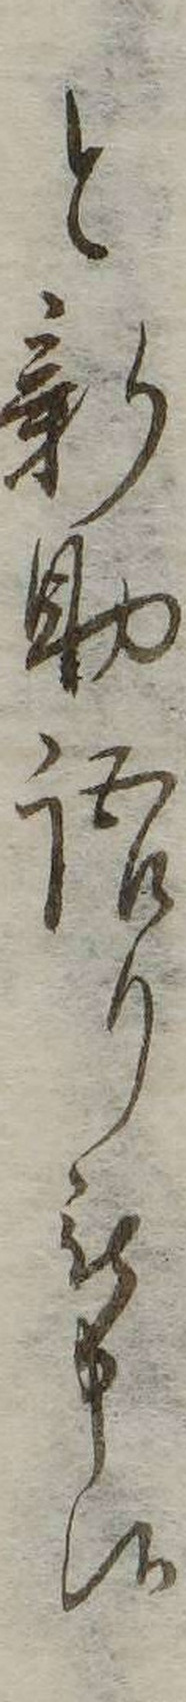と新助語り被申候
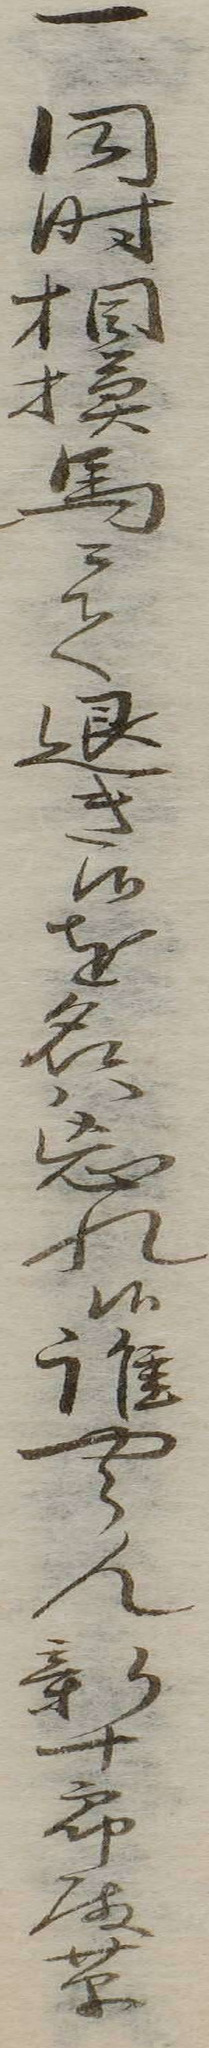一同時相模馬ニテ退き候を名は忘れ候誰やらん新十郎殿草
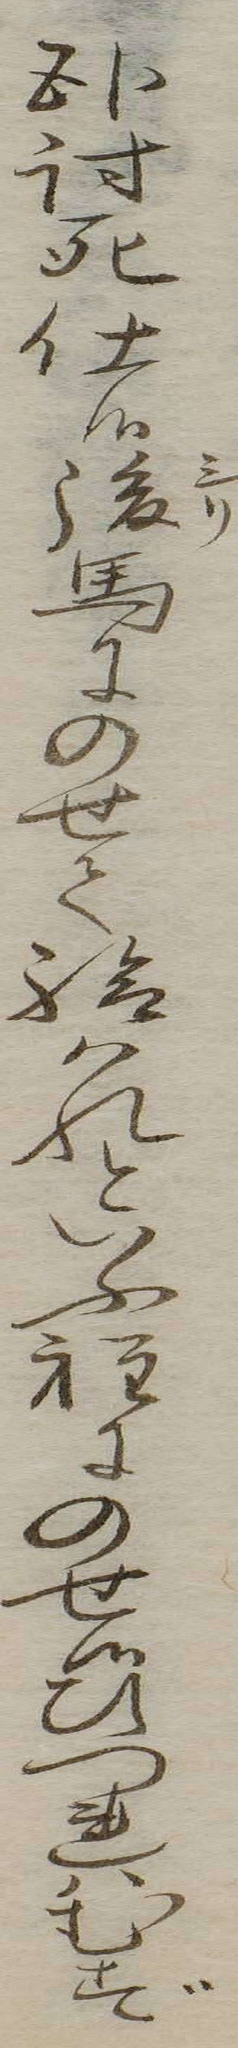臥討死仕候後馬にのせて給はれといふ程にのせ候ひつれはむず
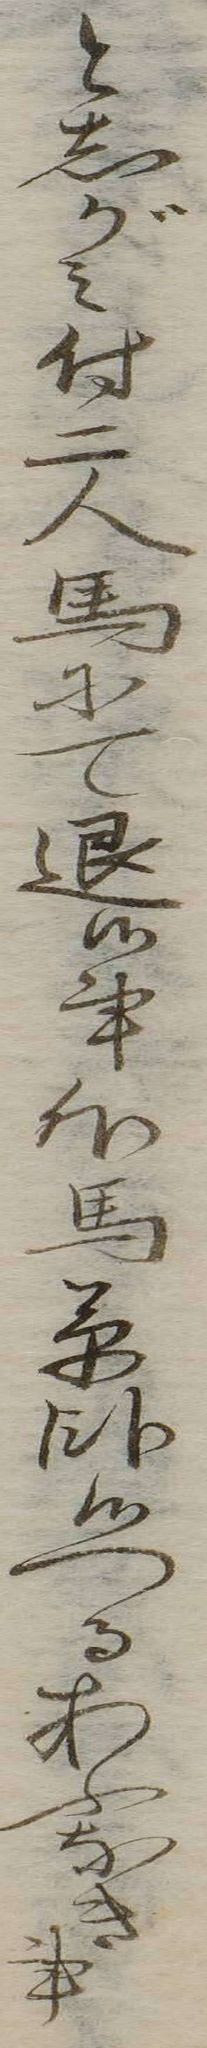としがみ付二人馬にて退候事外馬草臥候つるあふなき事
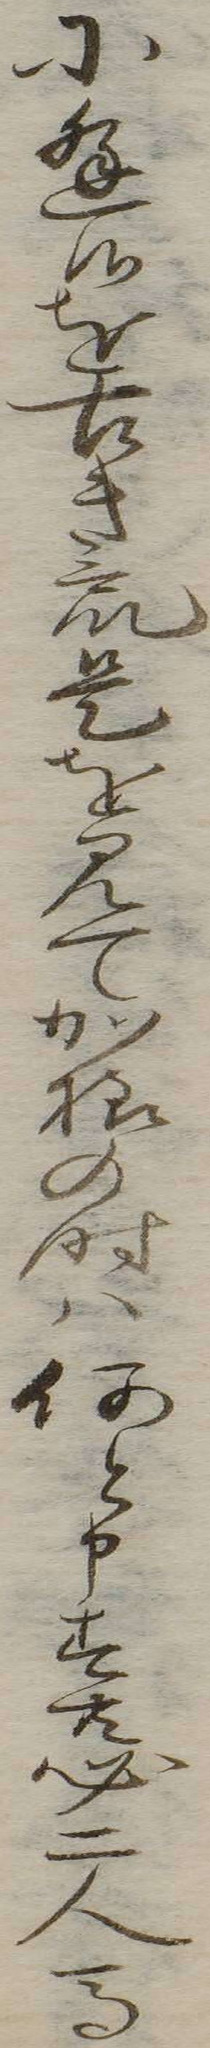に逢候を古き衆是を見てか様の時は何と申す共必二人馬
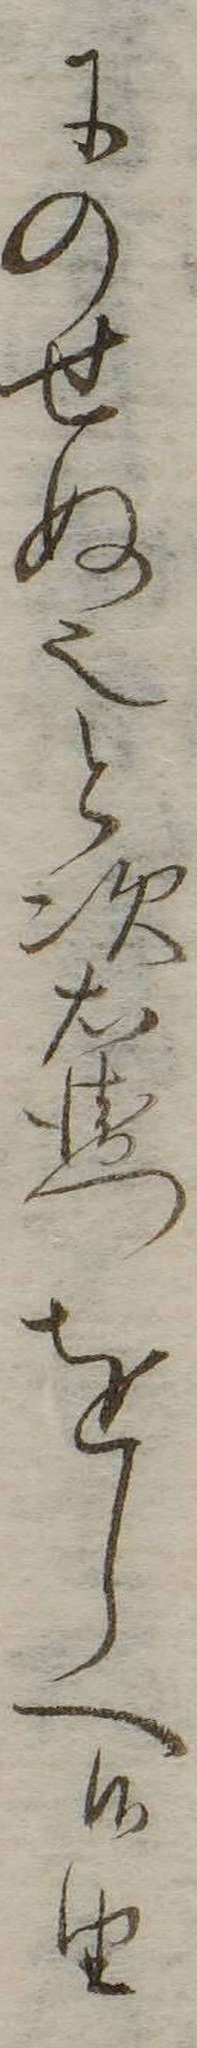にのせぬ也と次右衛門をしへ候由
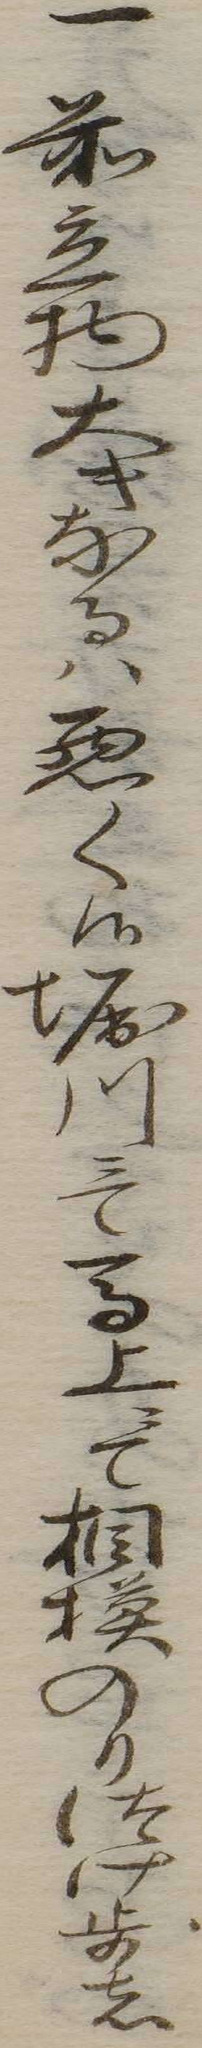一前立物大きなるは悪く候堀川ニて馬上ニて相模のりつけ歩者

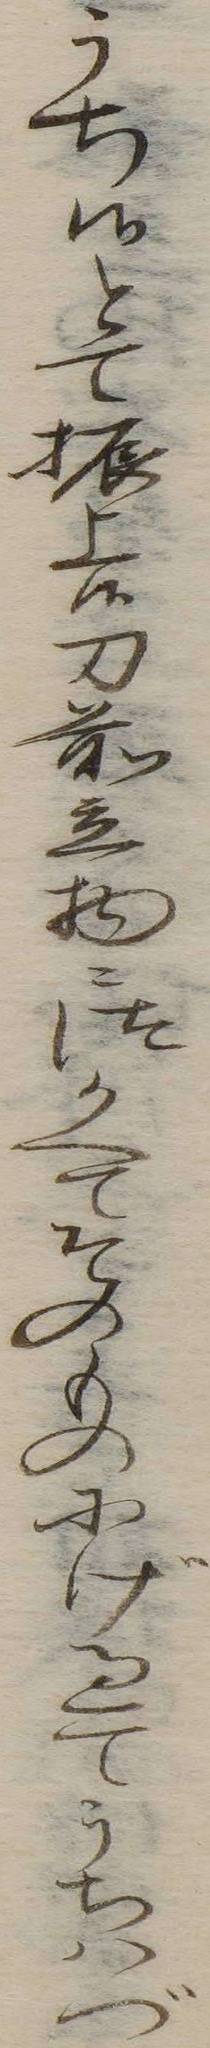うち候とて振上候刀前立物につかへてそのものにげ過てうちはづ
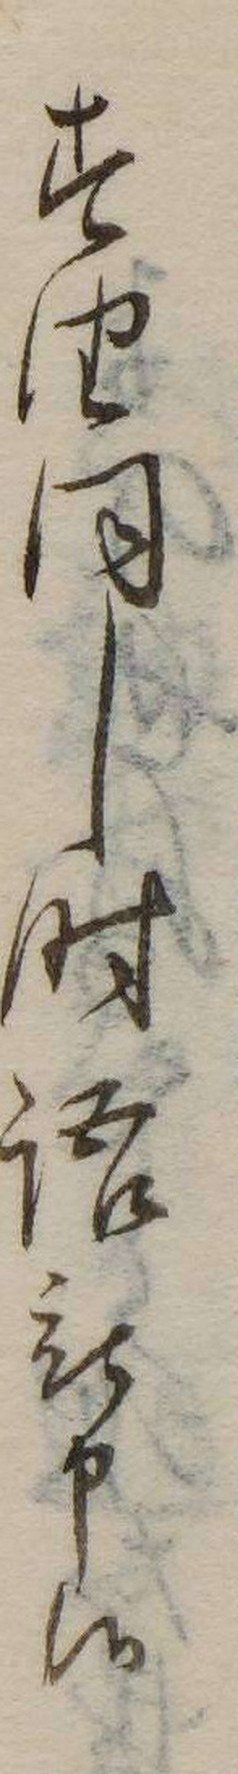す由同し時語被申候
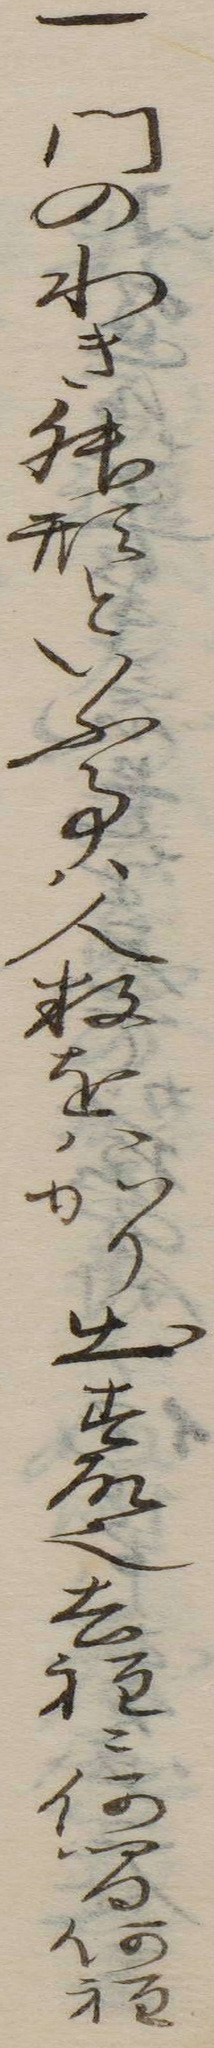一門のわき升形といふ事は人数をはかり出す故也去程に何間何程
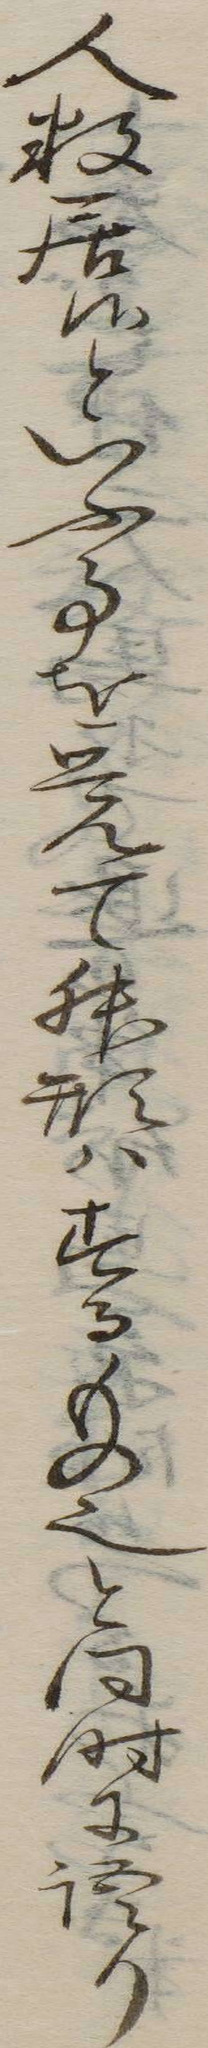人数居候といふ事を覚て升形はするもの也と同時に語り
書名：三河之物語
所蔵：国文学研究資料館
